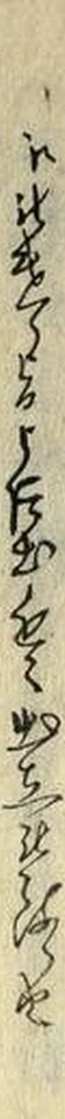江被遣候旨被仰出近々出立被致候由
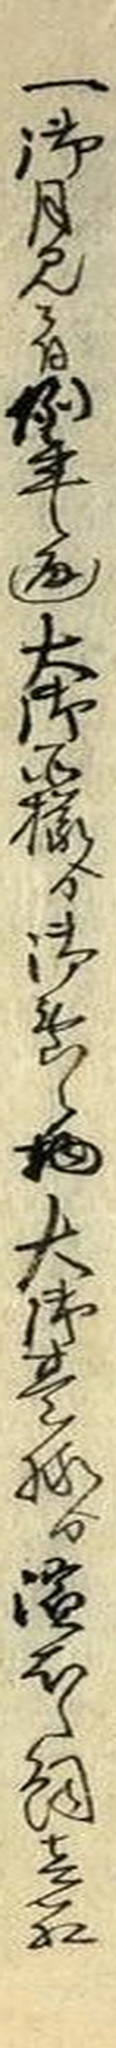一御月見ニ付例年之通大御所様ゟ御台之物大御台様ゟ浜ほし鯛壱箱
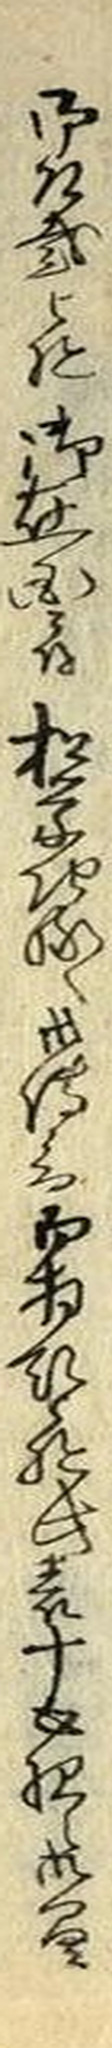御頂戴被遊御在国ニ付松栄院様へ御伝ニ而御拝領被遊此表十五夜之御間ニ
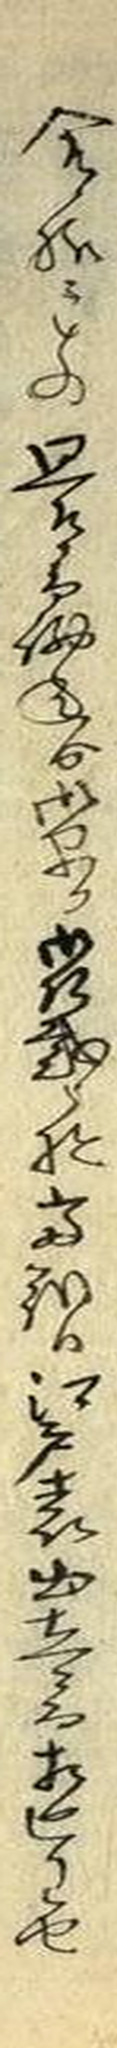合候様ニとの思召ニ而例年ゟ御早ク御頂戴被遊当朔日江戸表出立ニ而相廻り候由
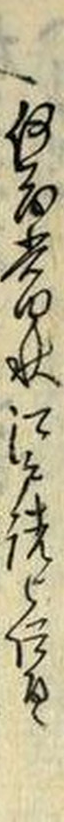何茂当秋江戸詰被仰付候
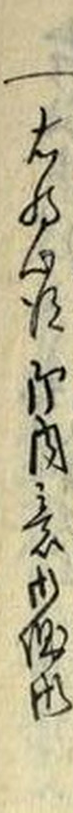右為心得御内意御側御
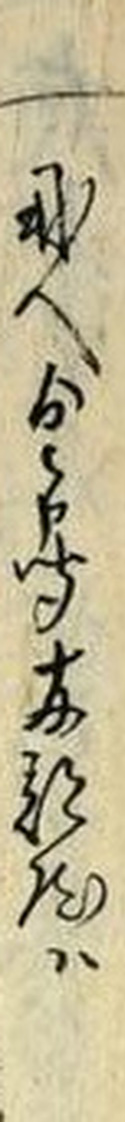用人ゟ被申聞両部屋ハ
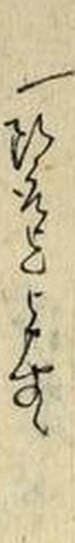頭取迄被申聞候
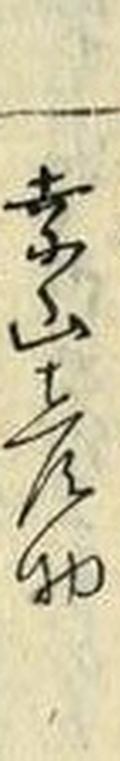桑山彦助
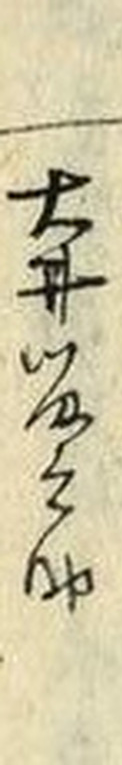大井留之助
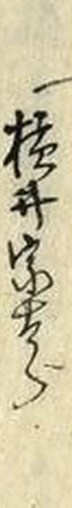横井宗太郎
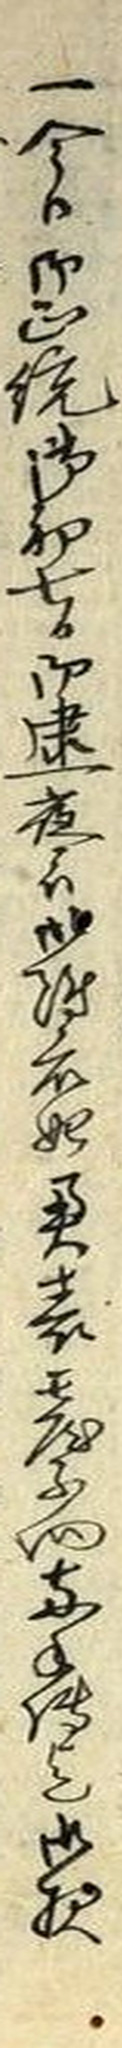一今日御正統御初七日御逮夜ニ付御附衆始奥表台子向両手伝迄御夜
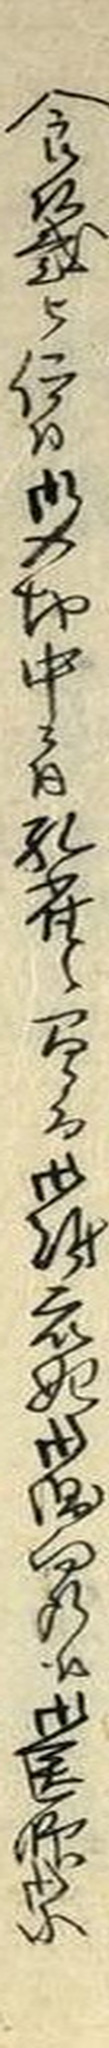食頂戴被仰付御〆切中ニ而孔雀之間ニ而御附衆始御側向頭取御医師御小
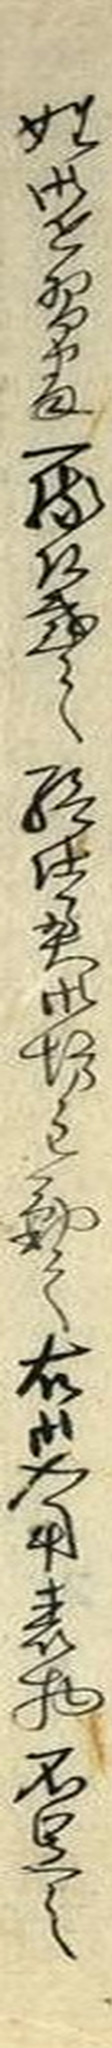姓御近習番一統頂戴之給仕奥御坊主勤之右御入用表物不足之
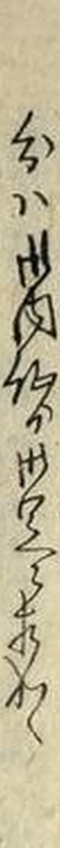分ハ御内証ゟ御足ニ相成候
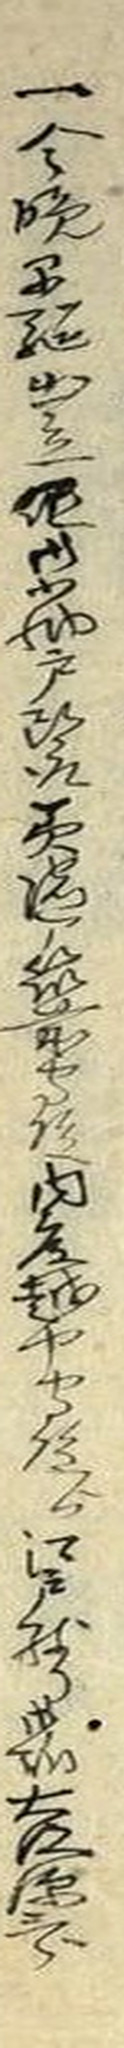一今晩早駆出立但御小納戸頭取美濃部筑前守殿内藤越中守殿ゟ江戸残り御附大沢源三郎
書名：少傅日録抄（斉善付側向頭取日記、江戸并道中、初入在国、逝去後…
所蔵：福井県文書館 Fukui Prefectural Archives
